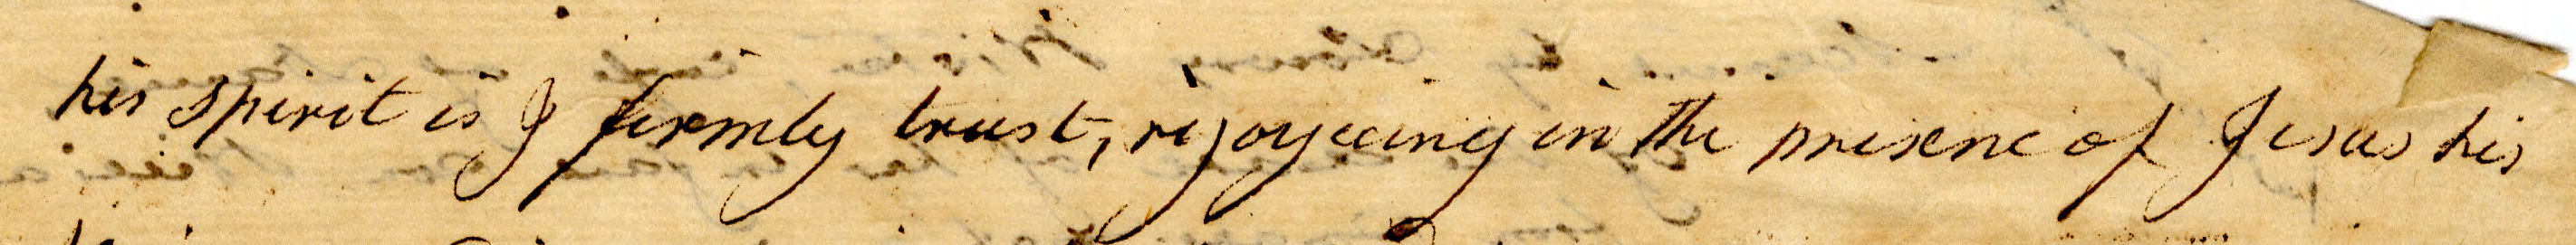his spirit is I firmly trust, rejoyceing in the presence of Jesus his
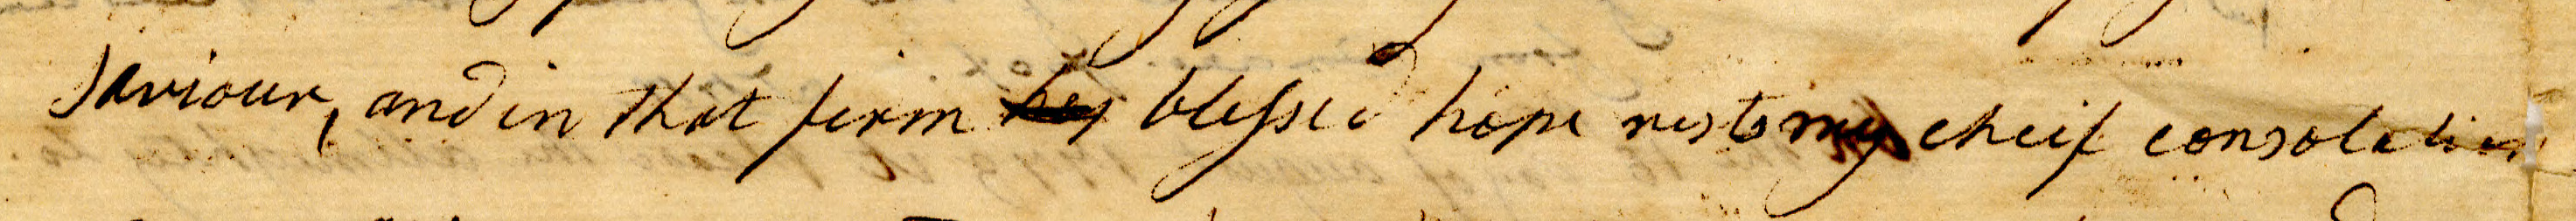Saviour, and in that firm [bes] blessed hope rests my chief consolation
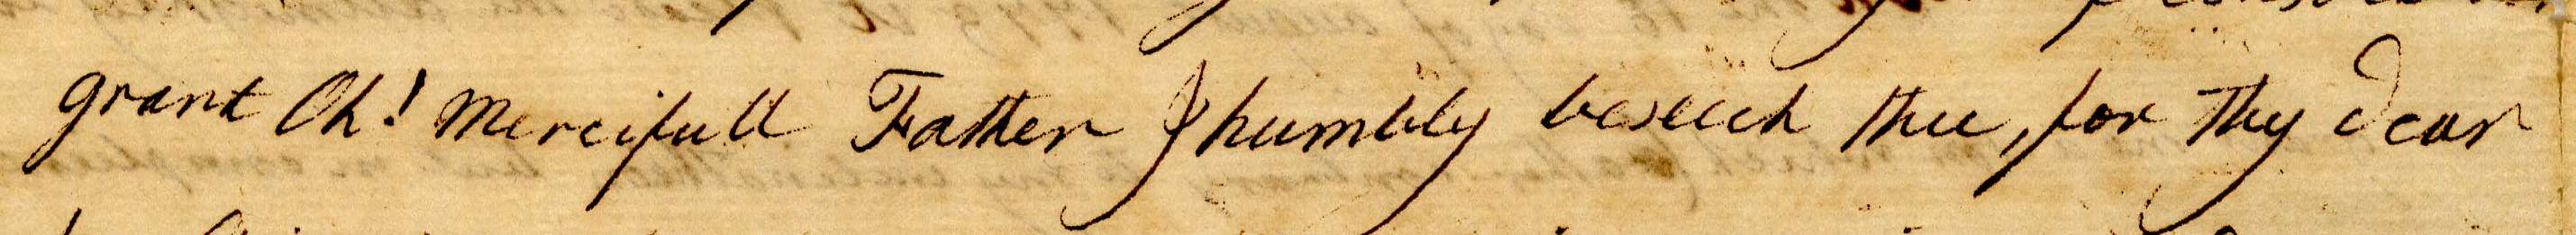grant Oh! mercifull Father I humbly beseech thee, for thy dear
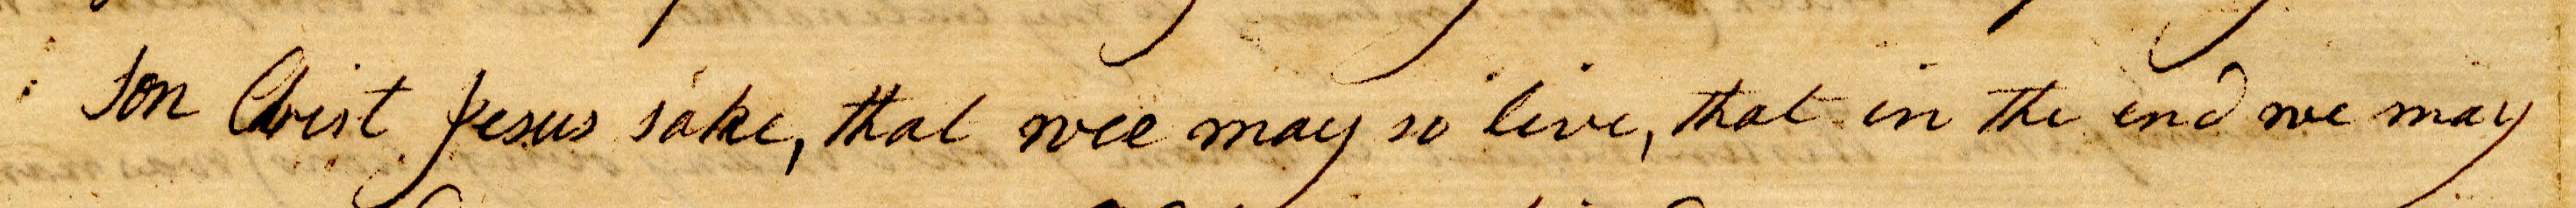son Christ Jesus sake, that wee may so live, that in the end we may
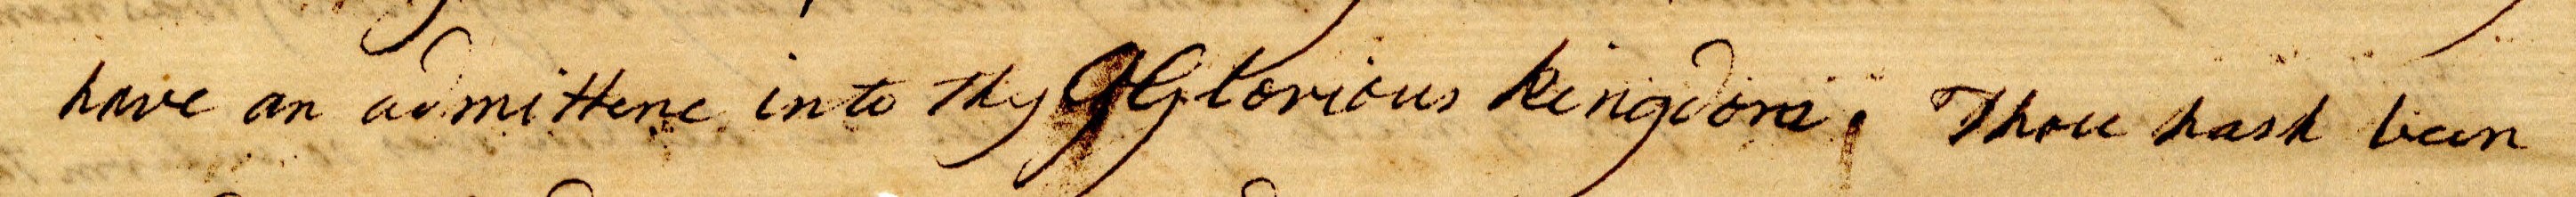have an admittence into thy [G] Glorious kingdom. Thou has been
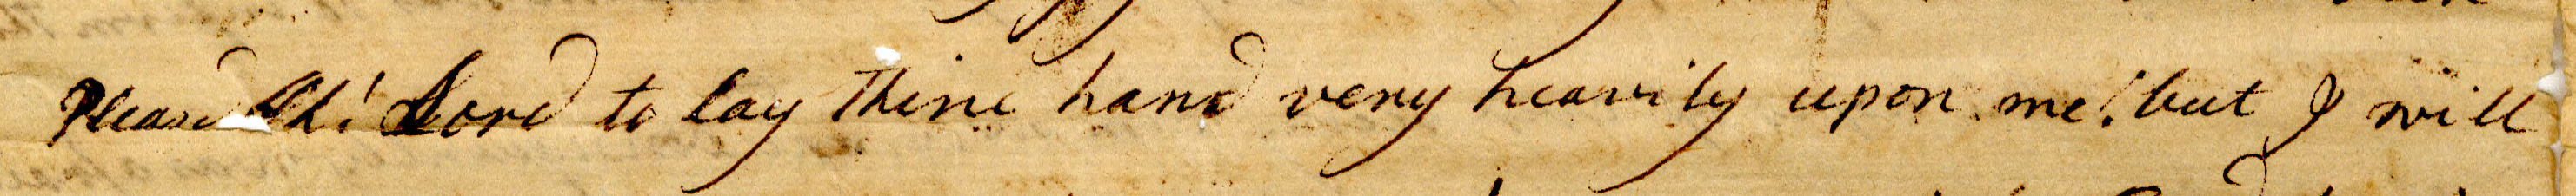pleased Oh! Lord to lay thine hand very heavily upon me: but I will
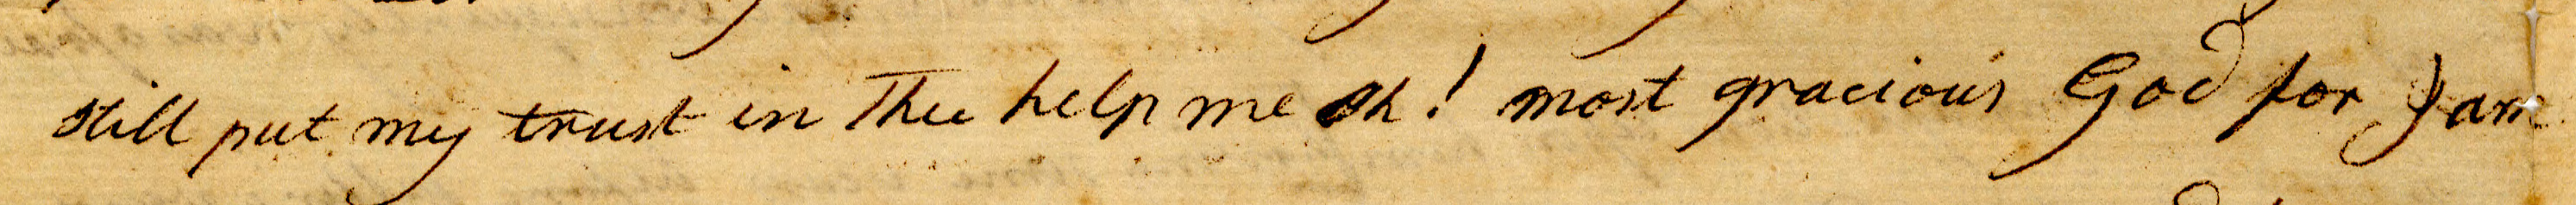still put my trust in thee help me oh! most gracious God for I am
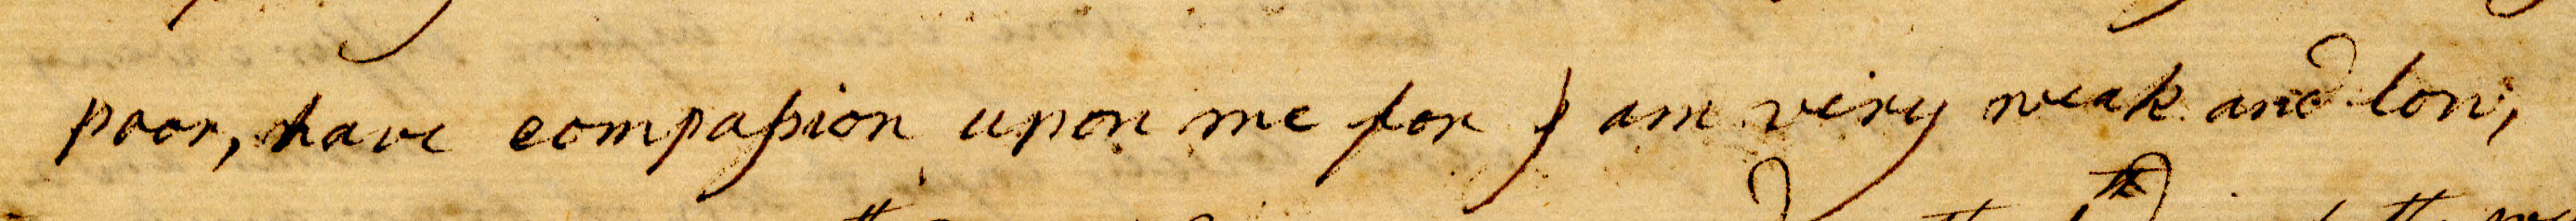poor, have compassion upon me for I am very weak and low,
